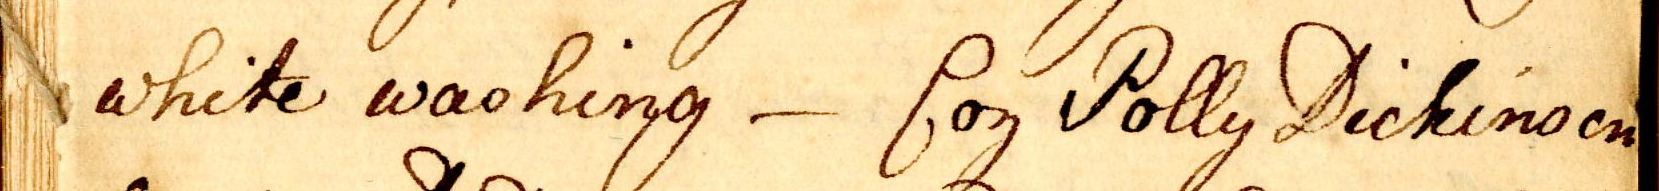white washing- Coz Polly Dickinson
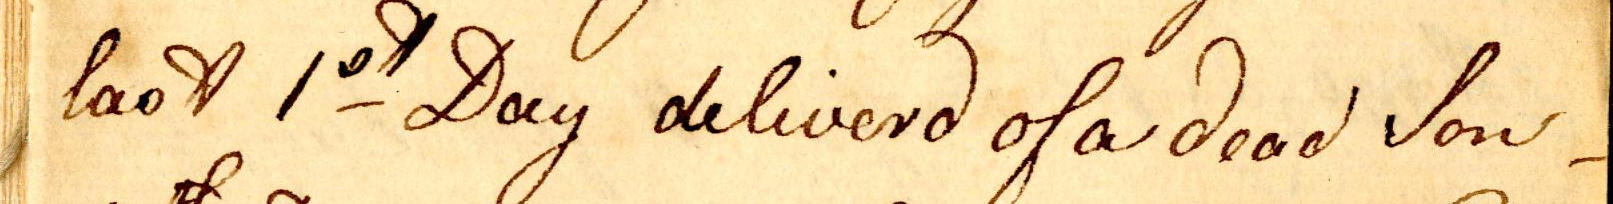last 1^st Day delivered of a dead Son-
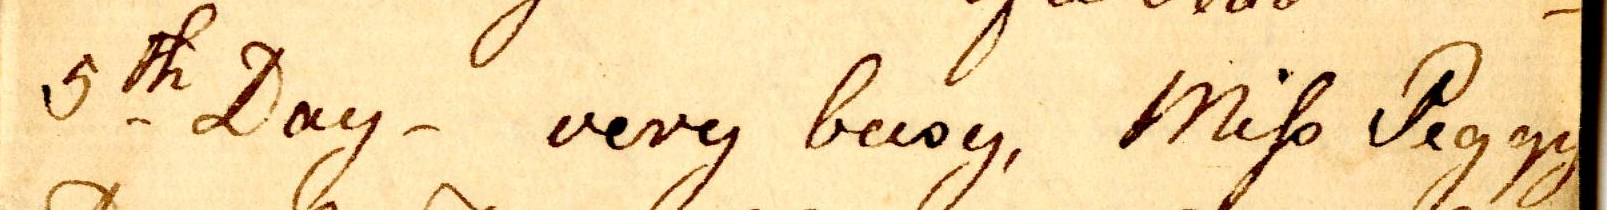5^th Day- very busy, Miss Peggy
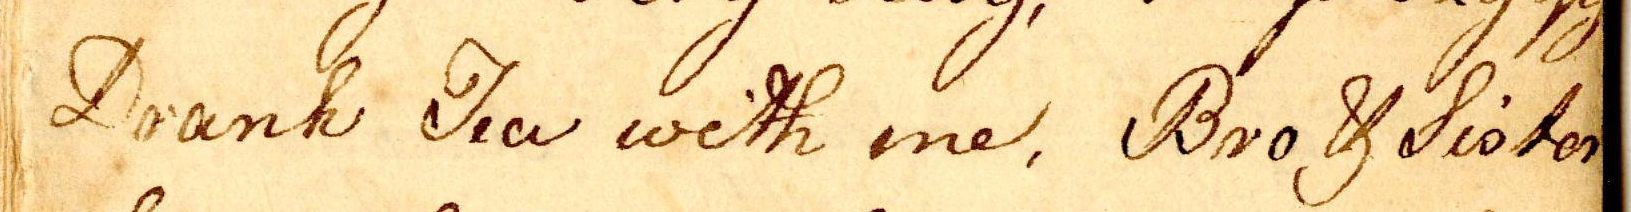Drank Tea with me, Bro & Sister
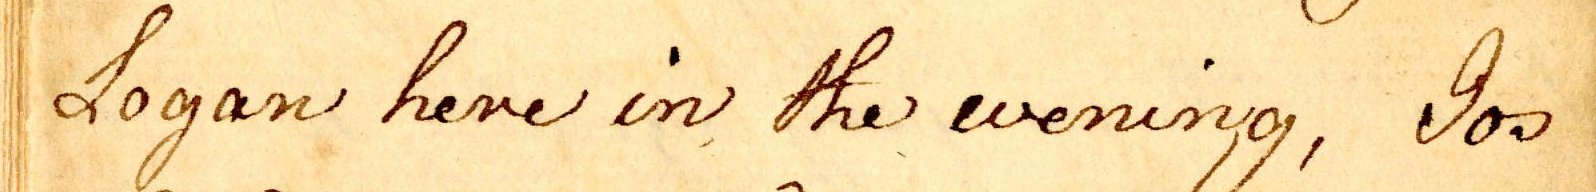Logan here in the evening, Jos
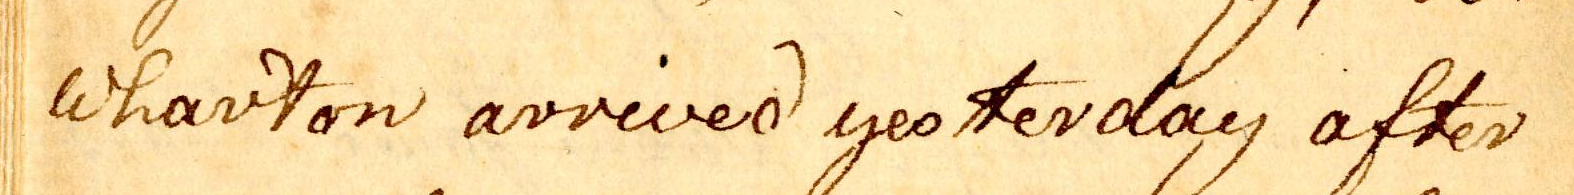Wharton arrived yesterday after
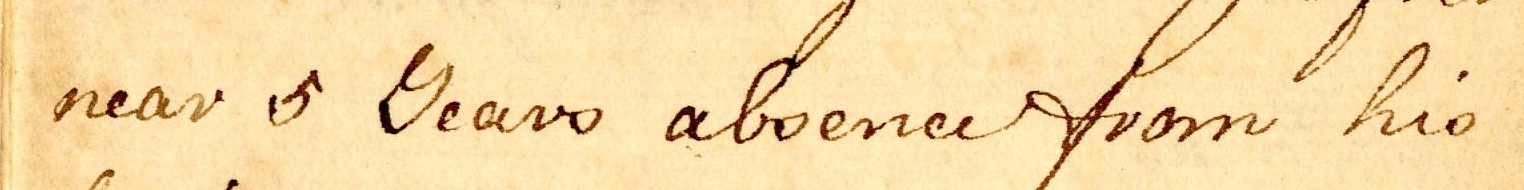near 5 Years absence from his
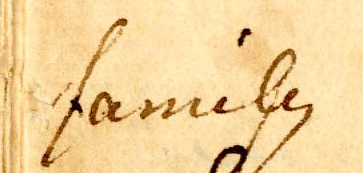family
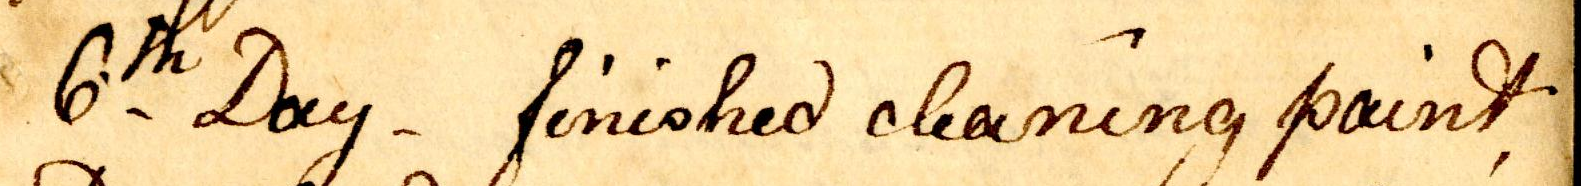6^th Day- finished cleaning paint
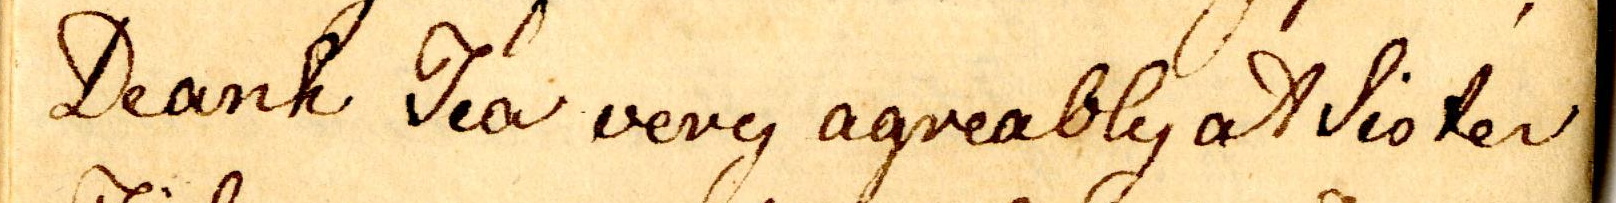Drank Tea very agreably at Sister
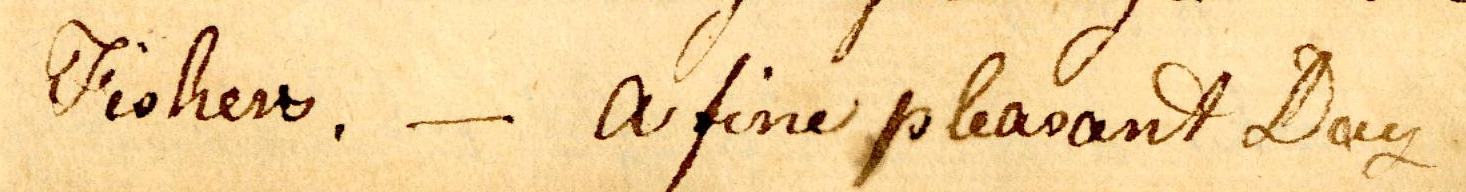Fishers- A fine pleasant Day
